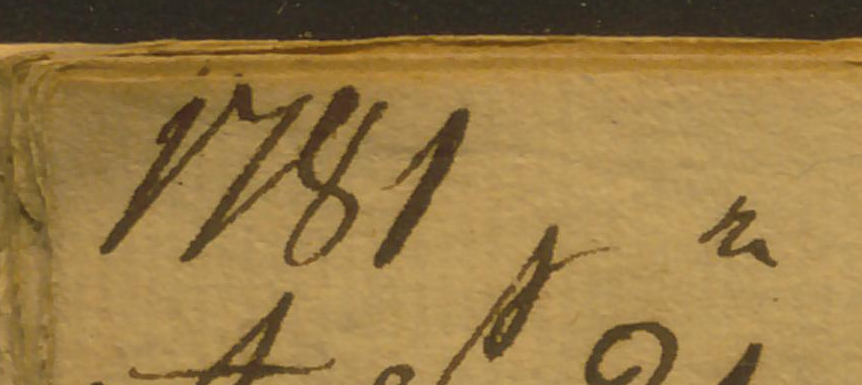1781
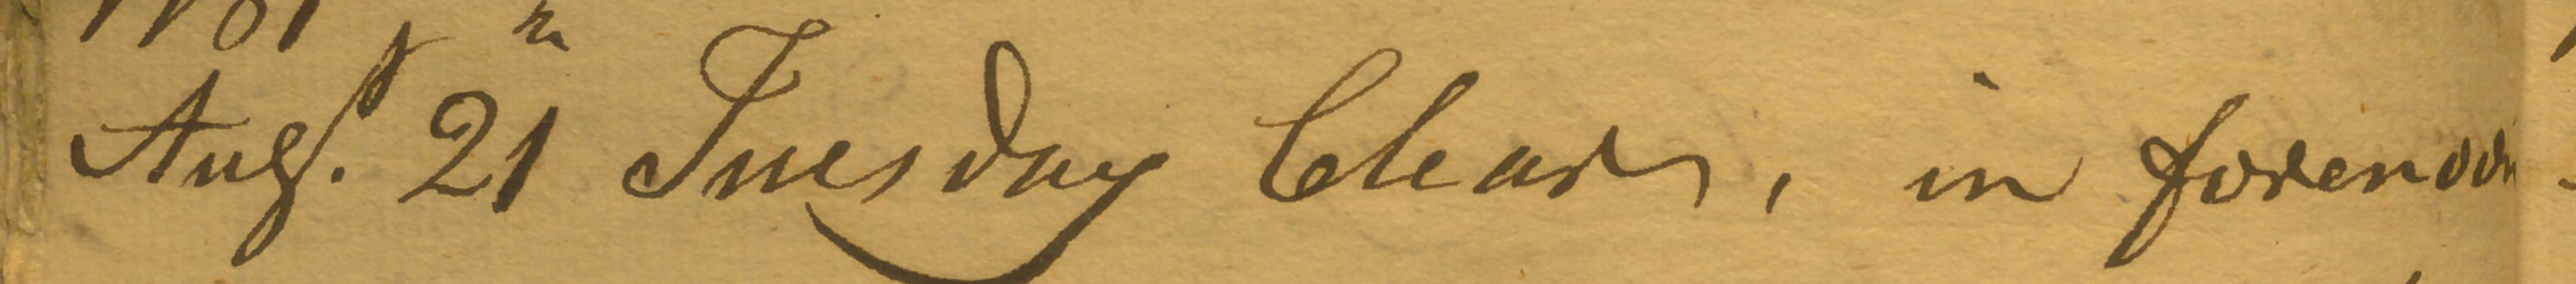Aug^t. 21 Tuesday Clear, in forenoon
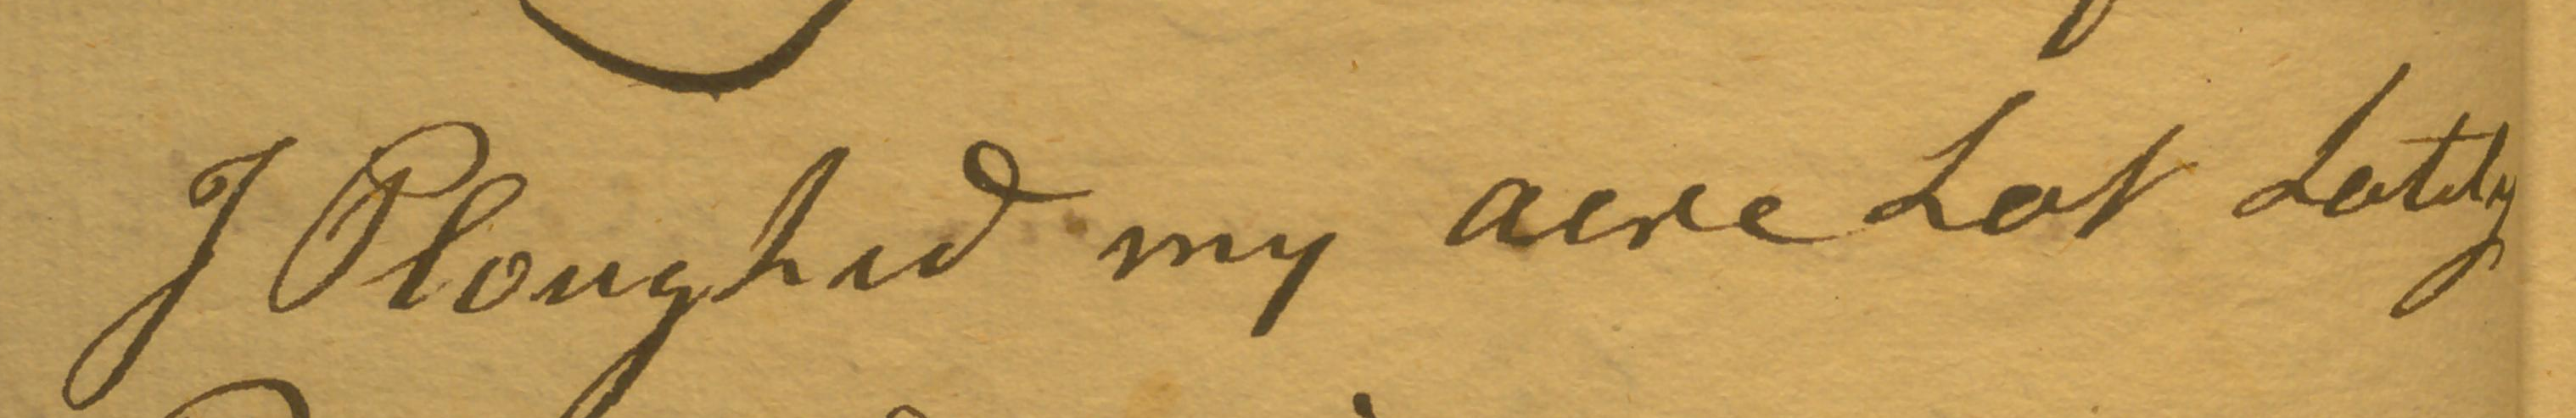I Ploughed my acre Lot Lately.
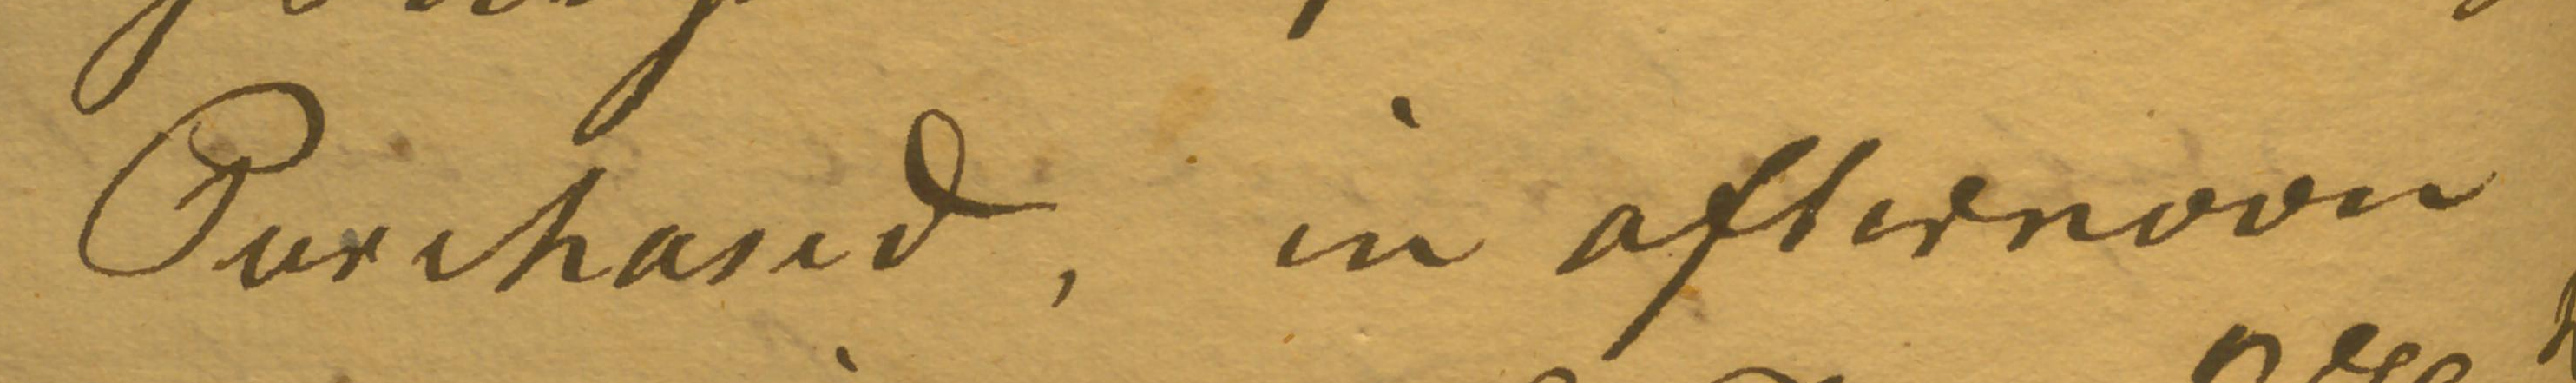Purchased, in afternoon
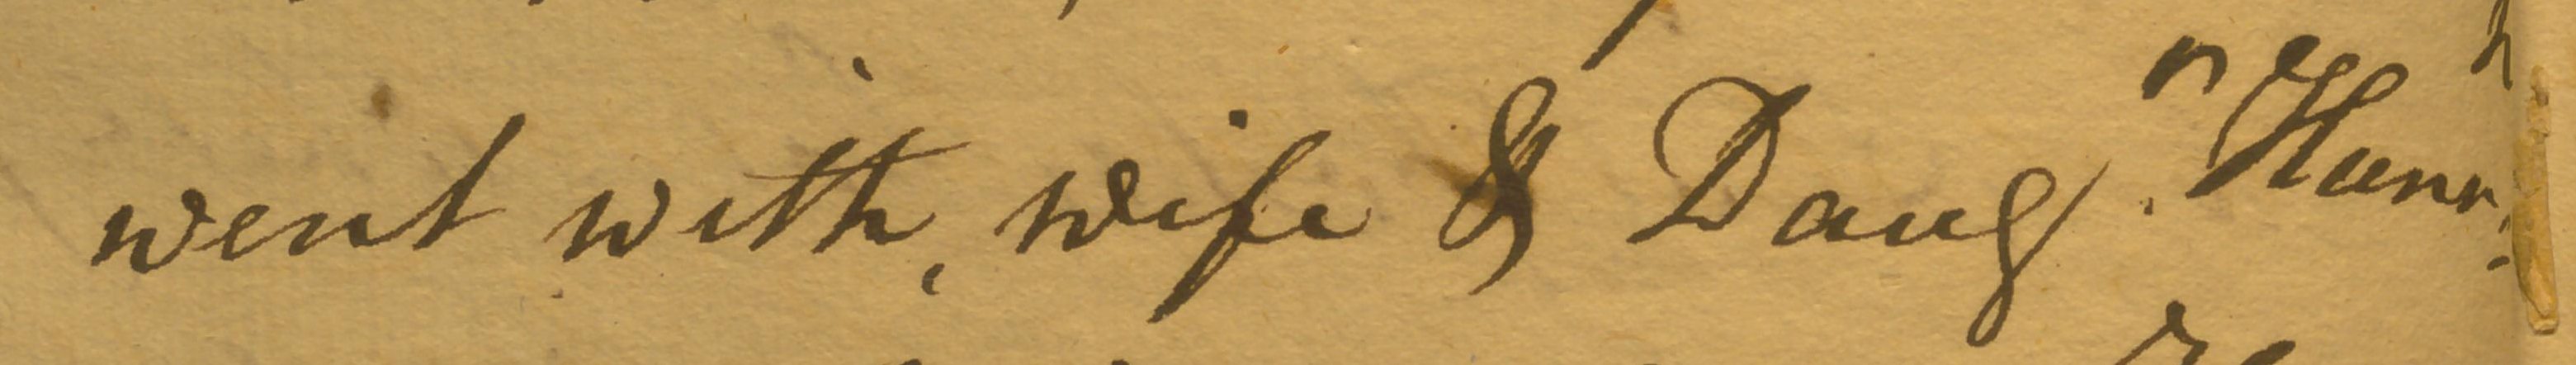went with wife & Daug^r. Hann^h:
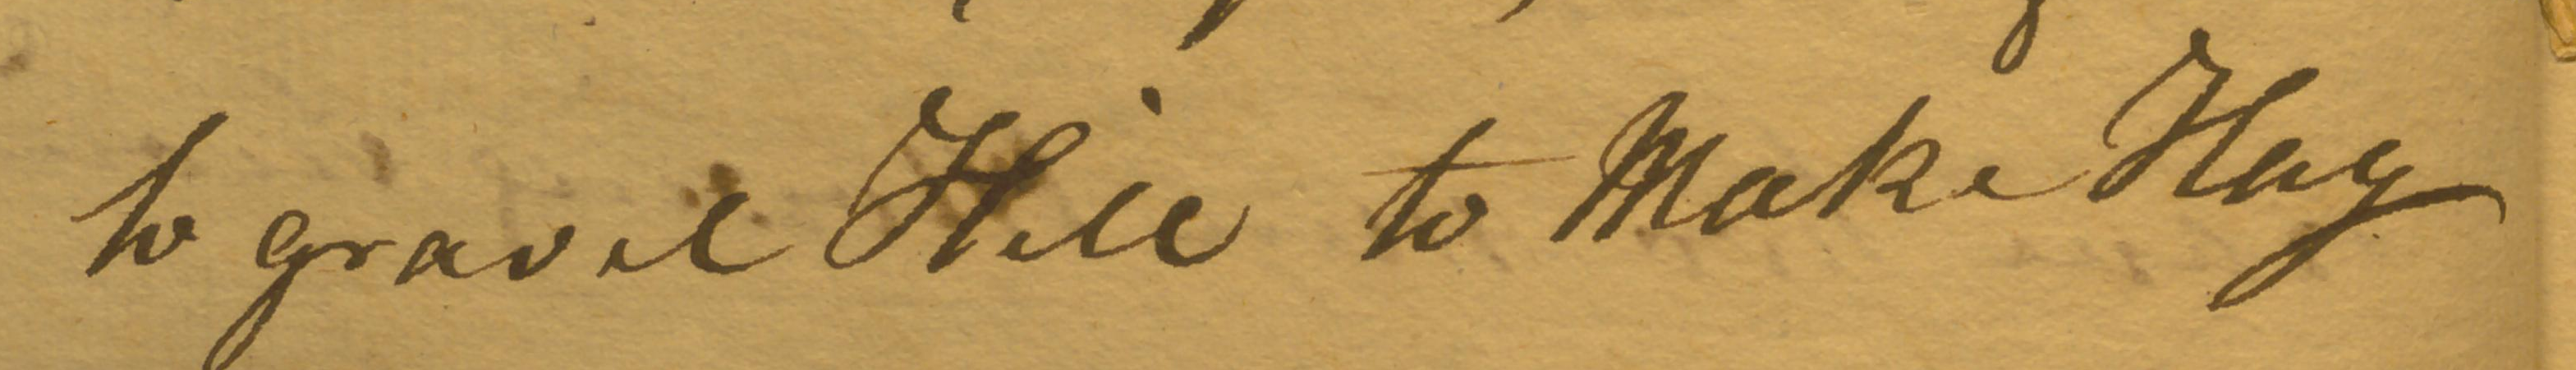to gravel Hill to Make Hay
